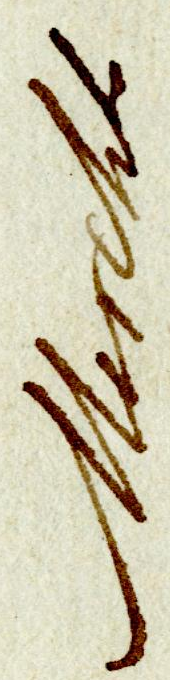Merch^t
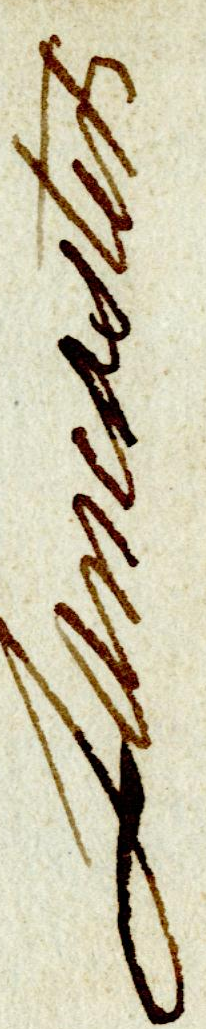Lancaster
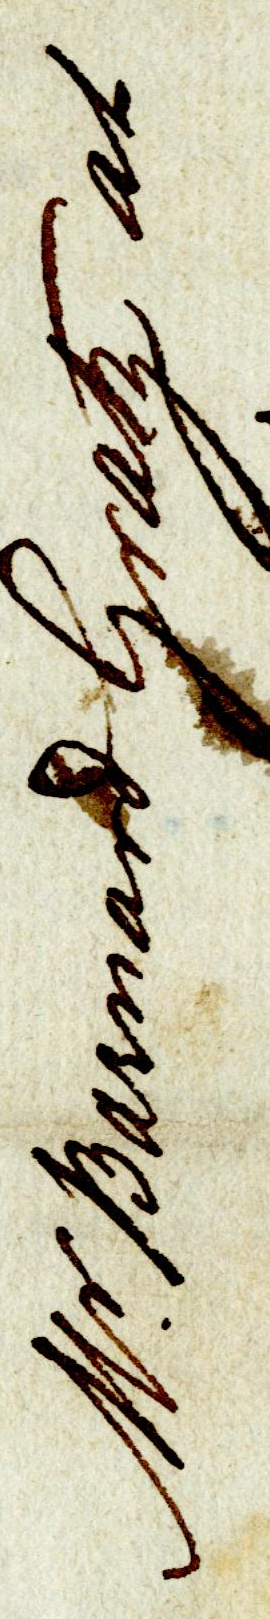M^r. Barnard Gratz at
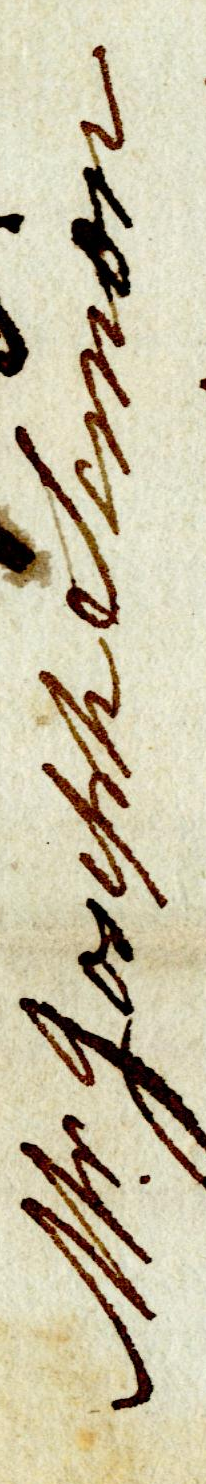M^r. Joseph Simon
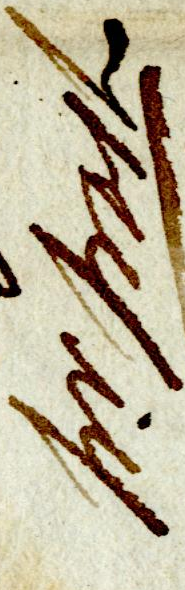pr. post
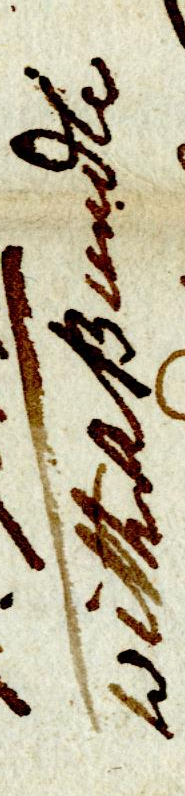With a bundle
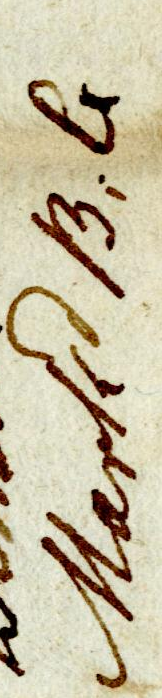Mark^d B, G
